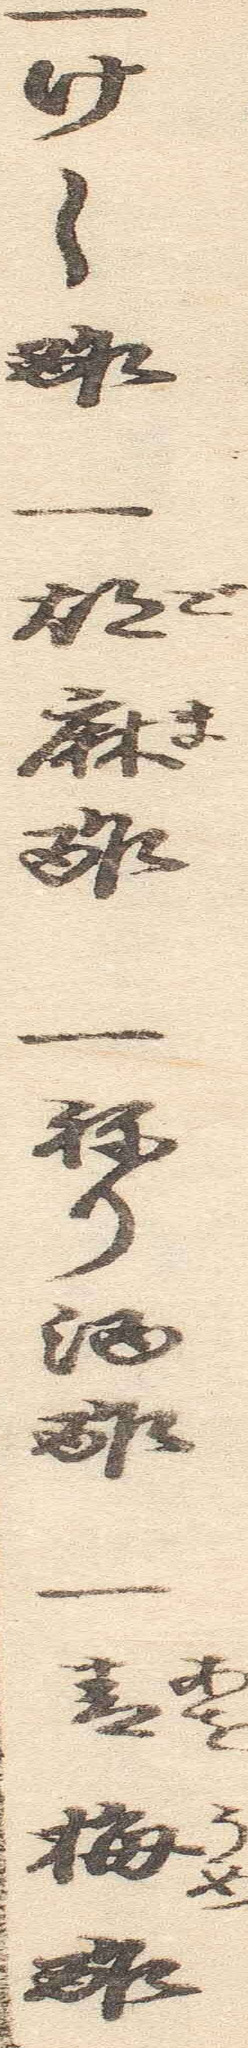一けし酢一胡麻酢一ねり酒酢一青梅酢
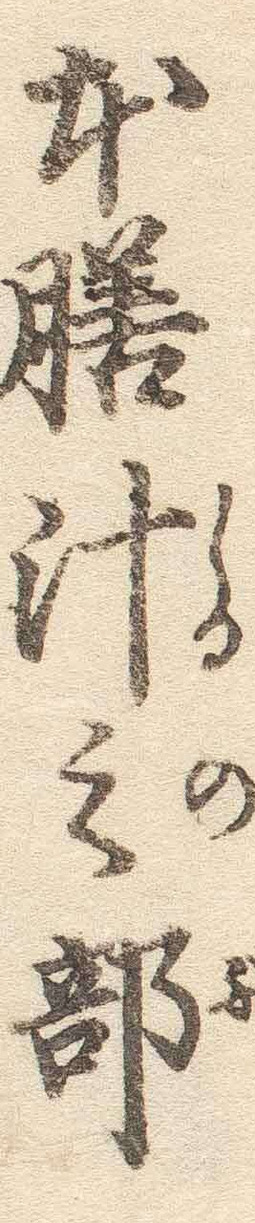本膳汁之部
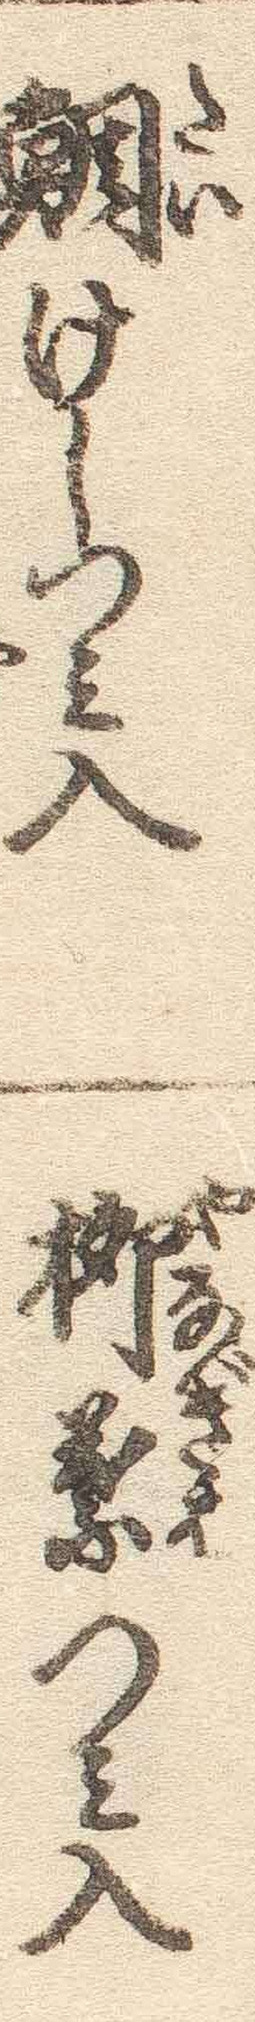鯛けしつみ入柳葉つみ入
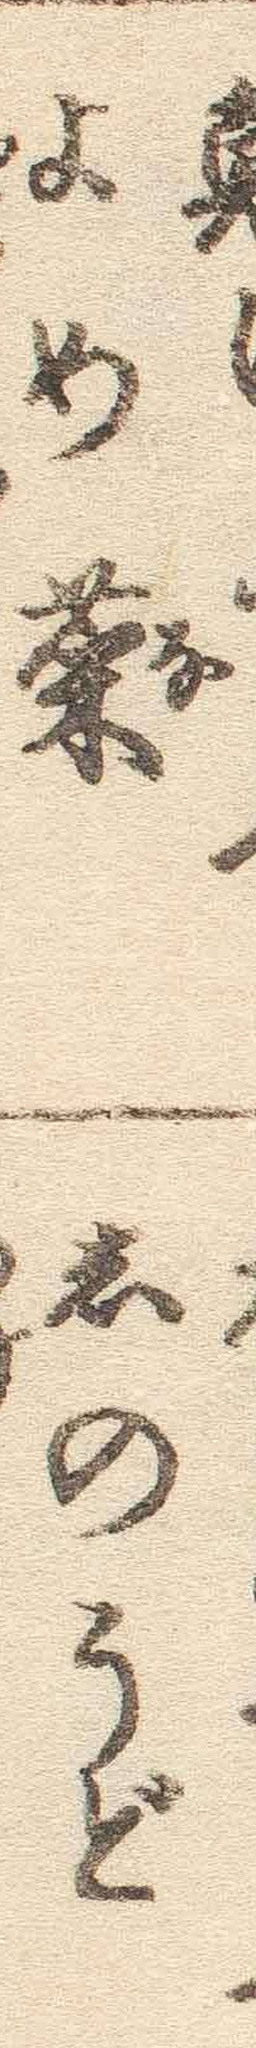春よめ菜しのうど
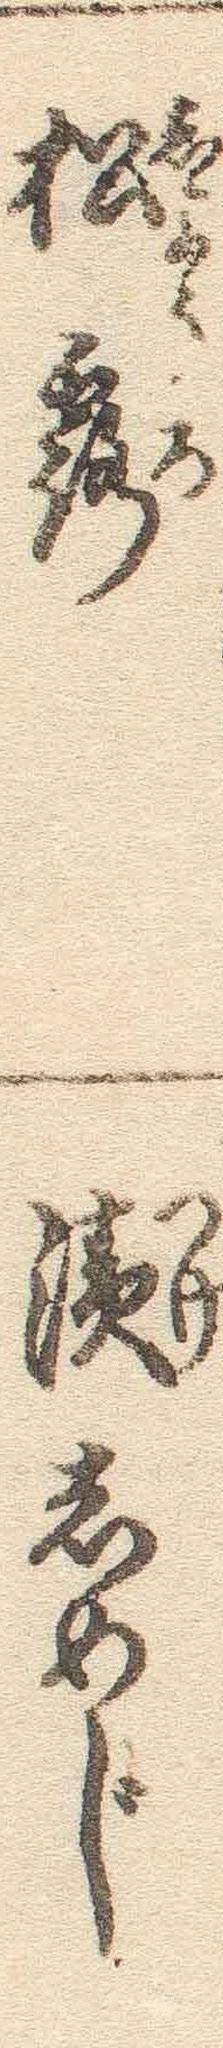松露漬しめじ
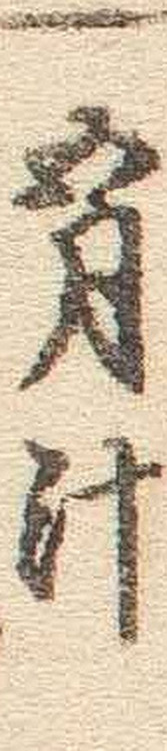五月汁
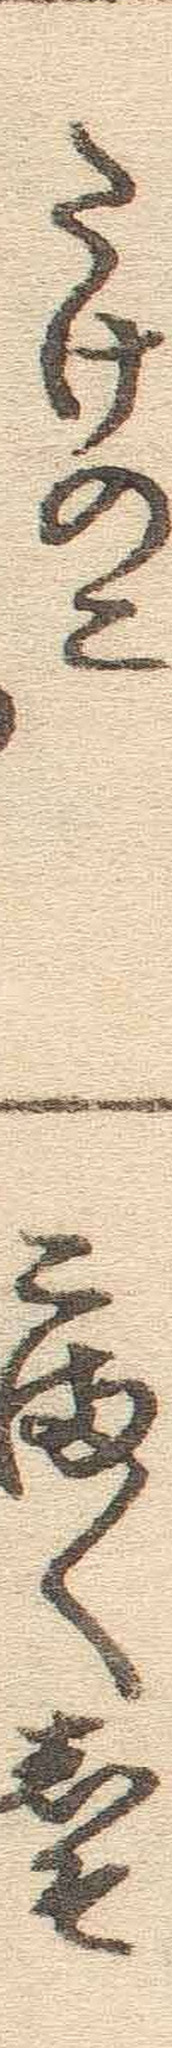夏ふきこま〳〵しそ
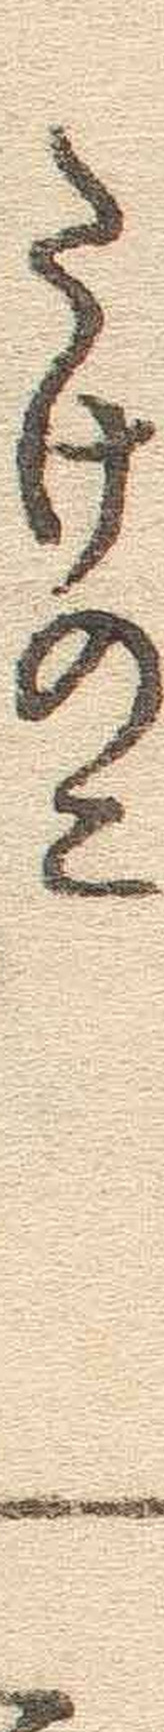たけのこ
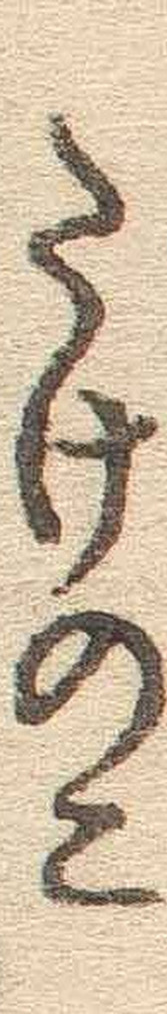たけのこ
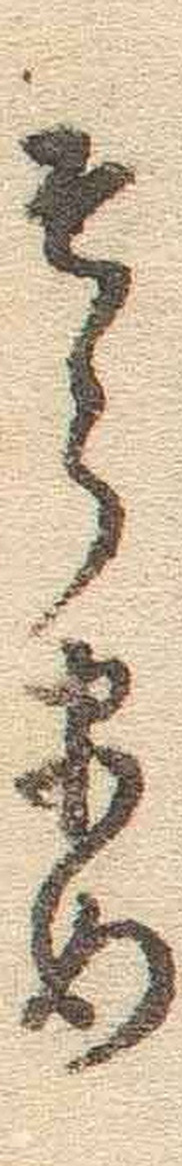そらまめ
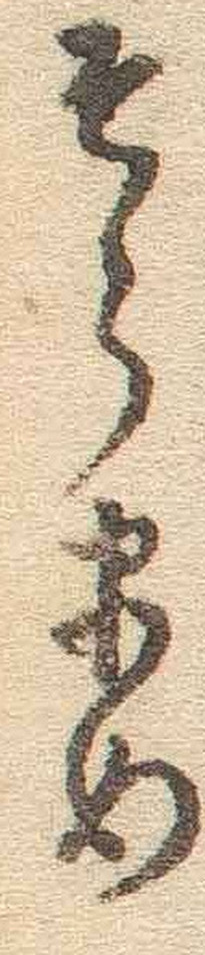そらまめ

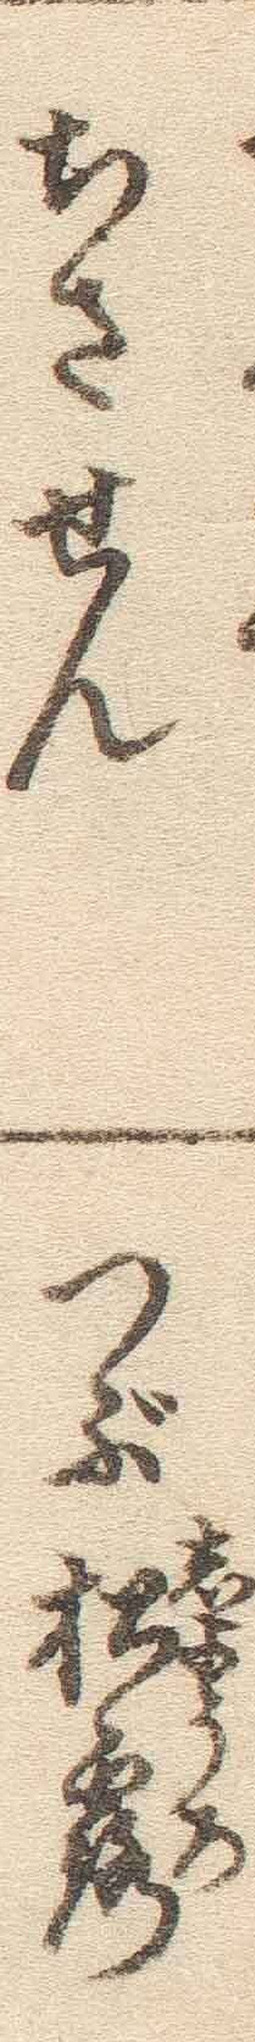ちさせんつぶ松露
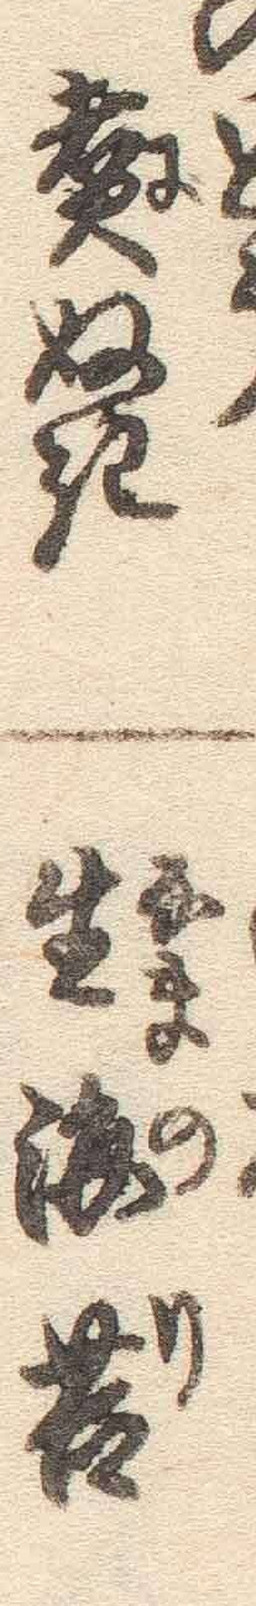煮ぬき生海苔
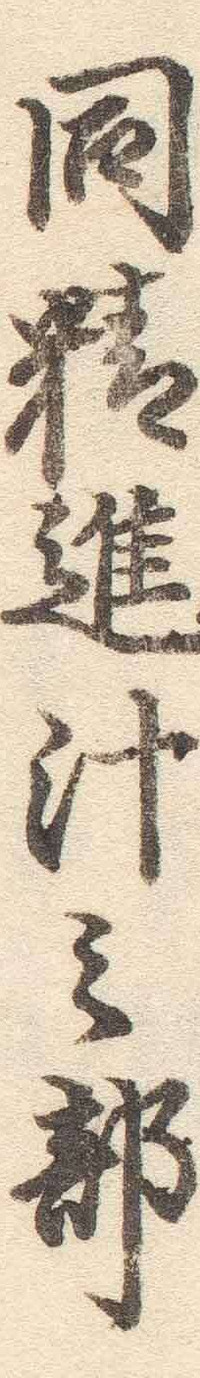同精進汁之部
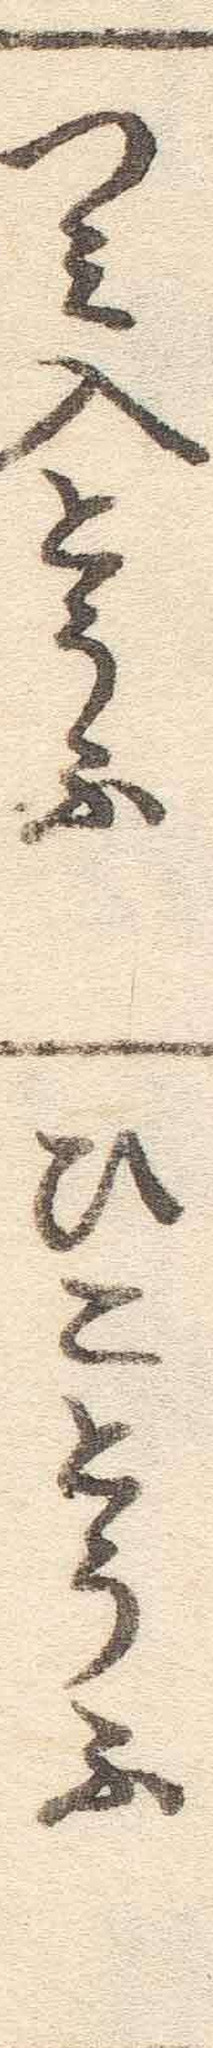つみ入とうふひことうふ
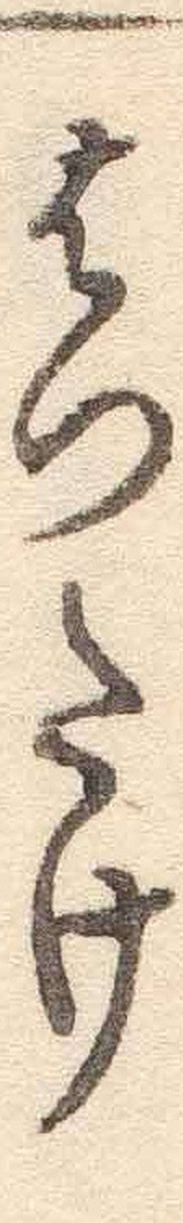はつたけ
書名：料理通
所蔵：東京学芸大学附属図書館 国文学研究資料館
